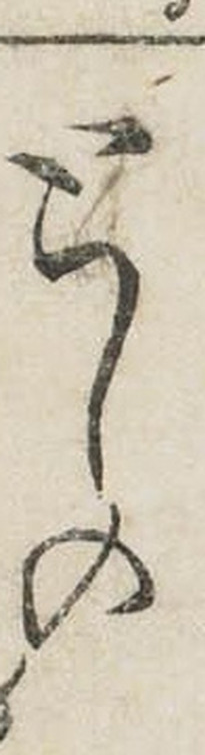としの

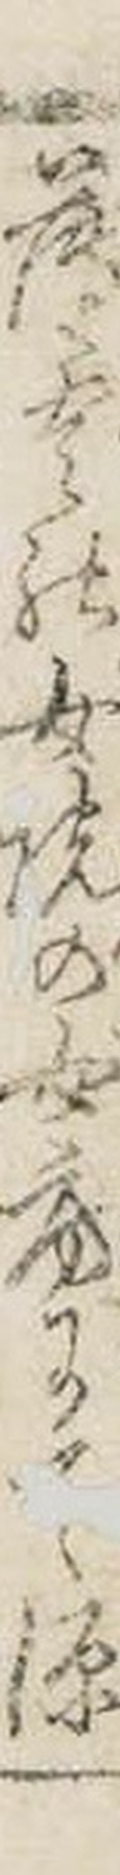薄雲の女院の女房にて源
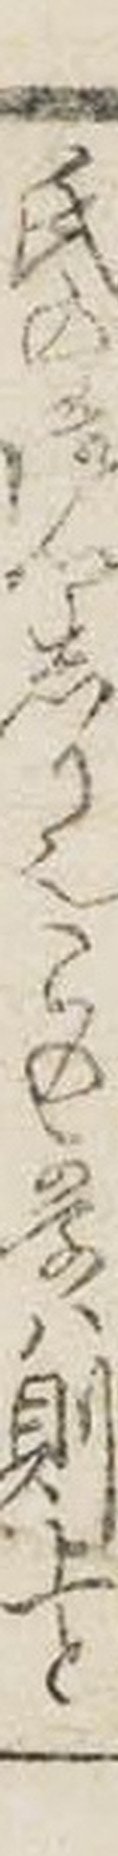氏の御心しり也この哥は則上と
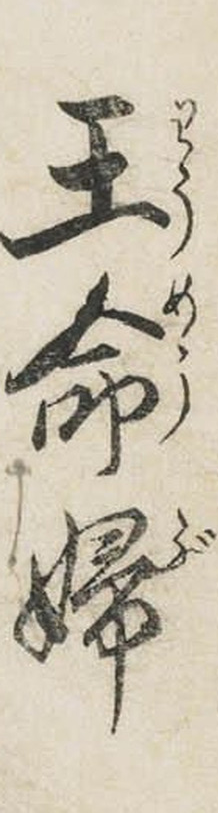王命婦
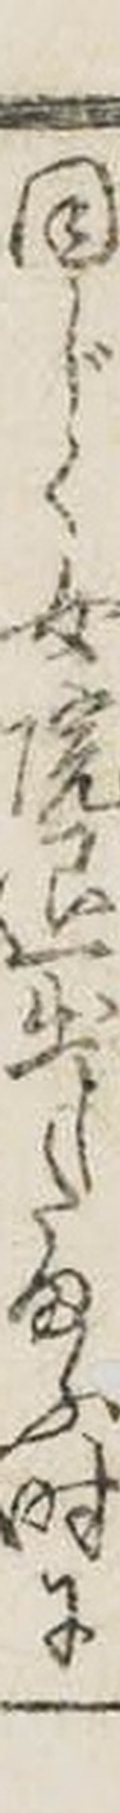同じく女院退出したまふ時に
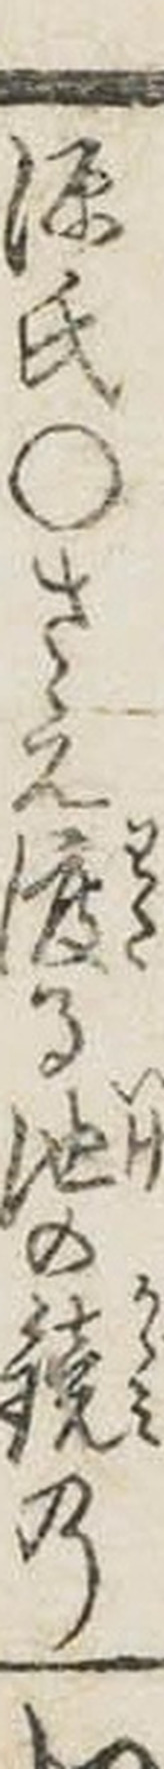源氏○さえ渡る池の鏡の
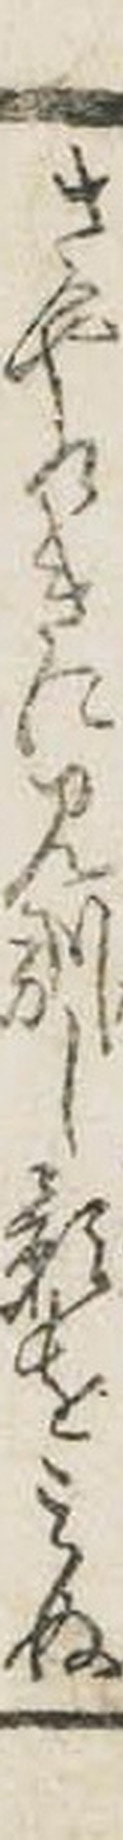さやけきに見馴し影をみぬ
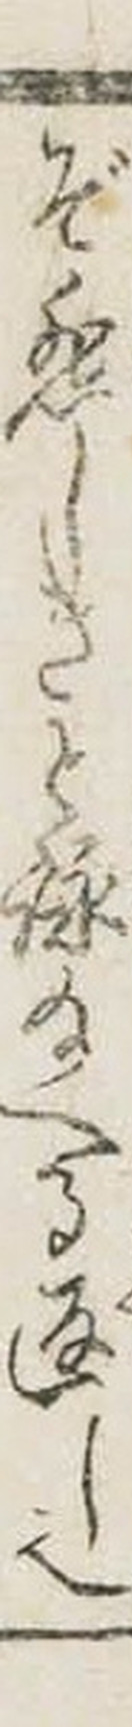ぞ悲しきと詠給へる返し也
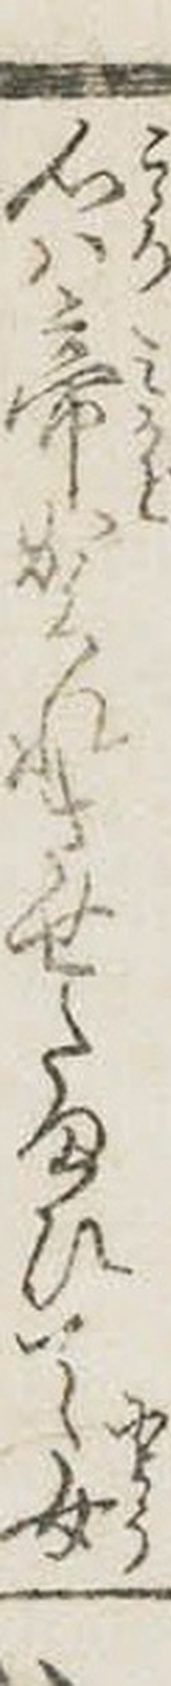心は帝かくれさせたまひて女
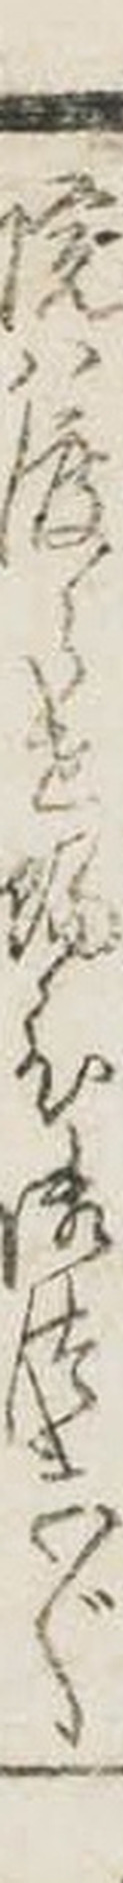院は渡らせ賜ひ御つき〴〵
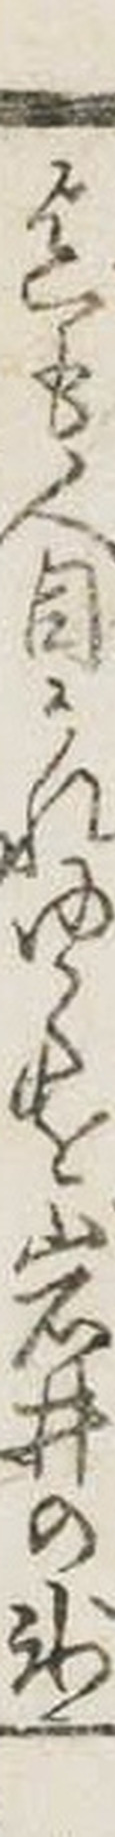迄も人目かれゆくを岩井の氷
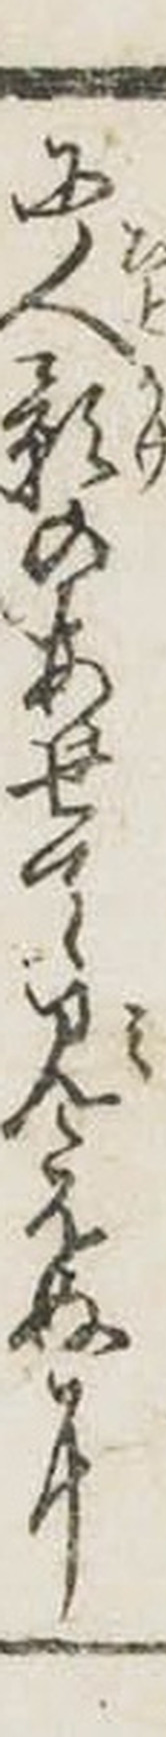に人影のあせて見えぬに
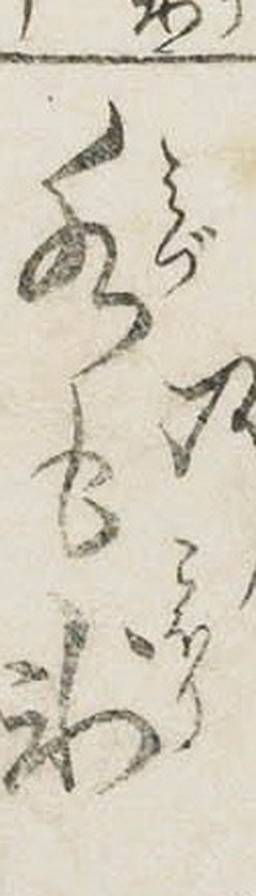水も氷
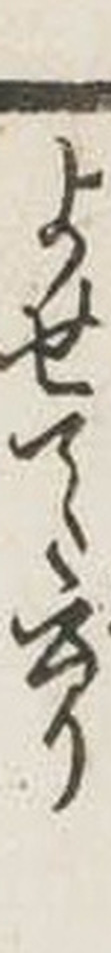よせて云り
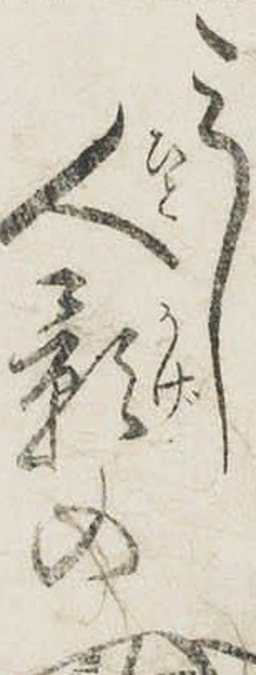人影の
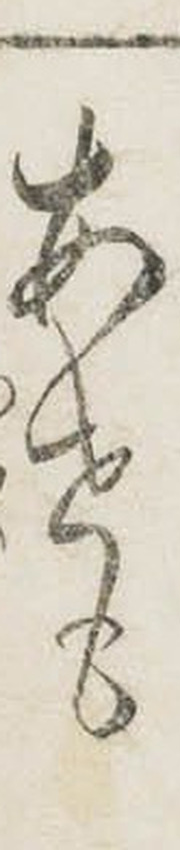あせも
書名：源氏百人一首
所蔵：東京学芸大学教育コンテンツアーカイブ
